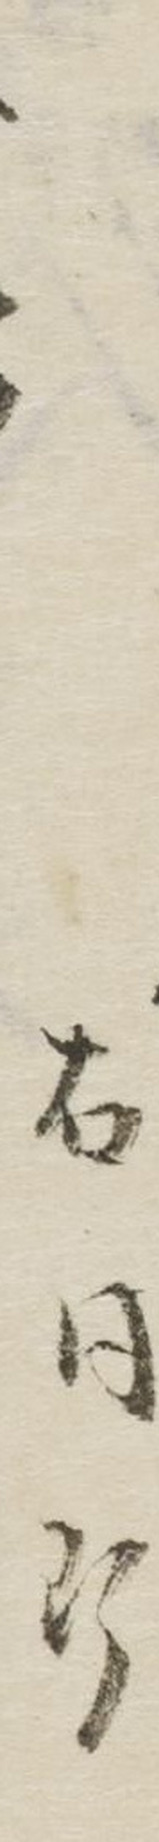右同断
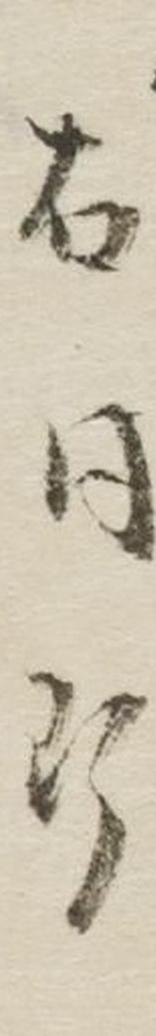右同断
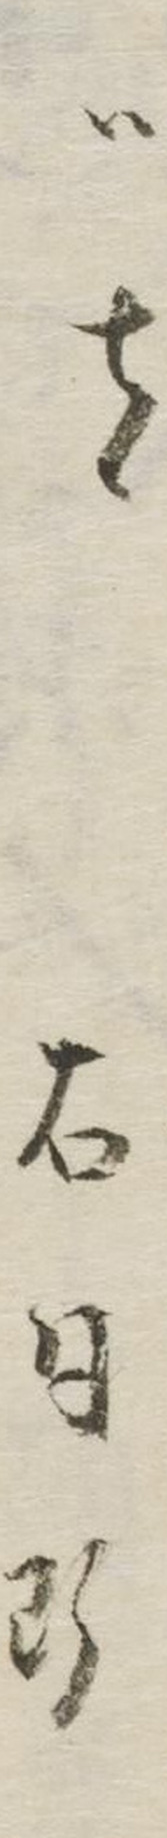〃七日右同断
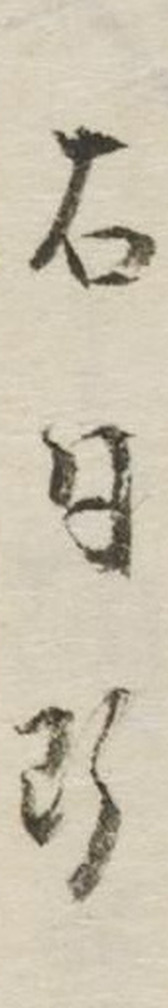右同断
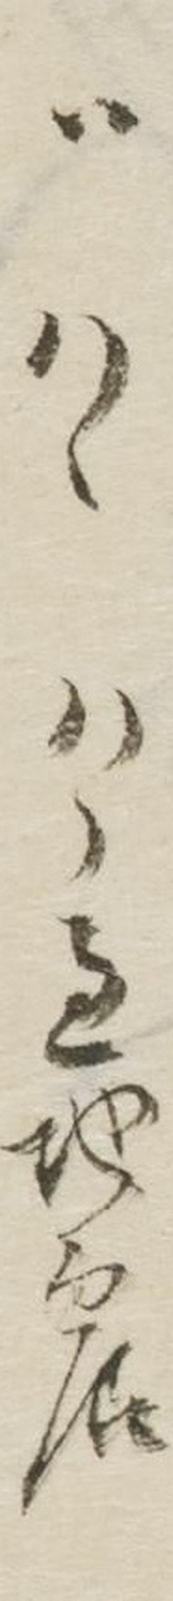〃八日八ツ過地震
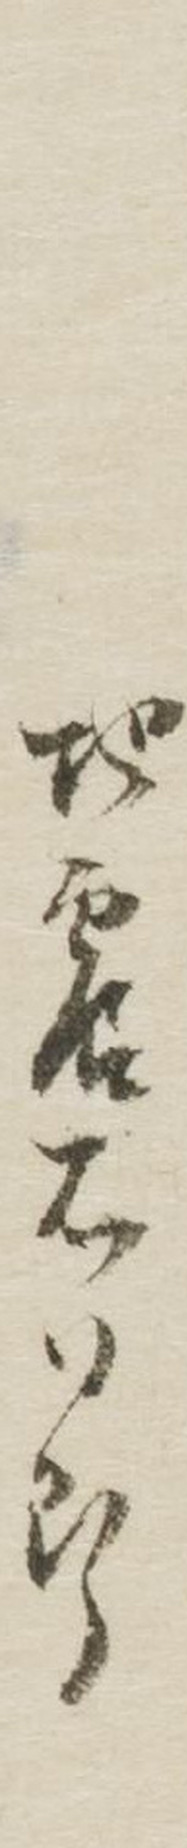地震右同断
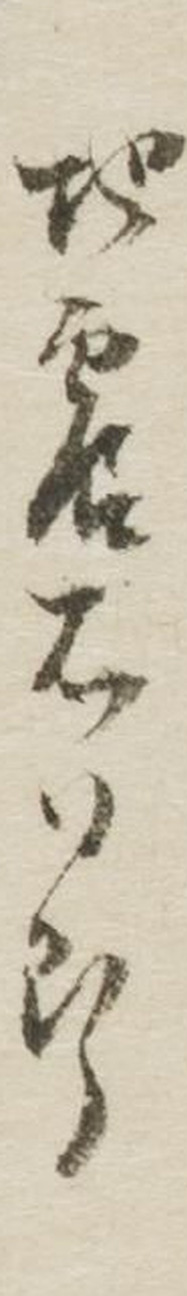地震右同断
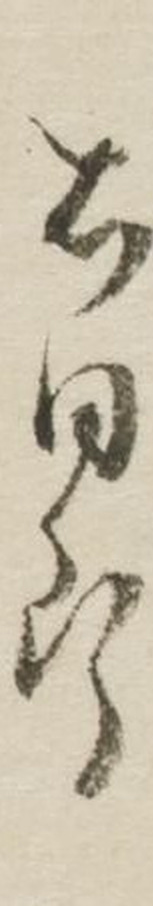右同断
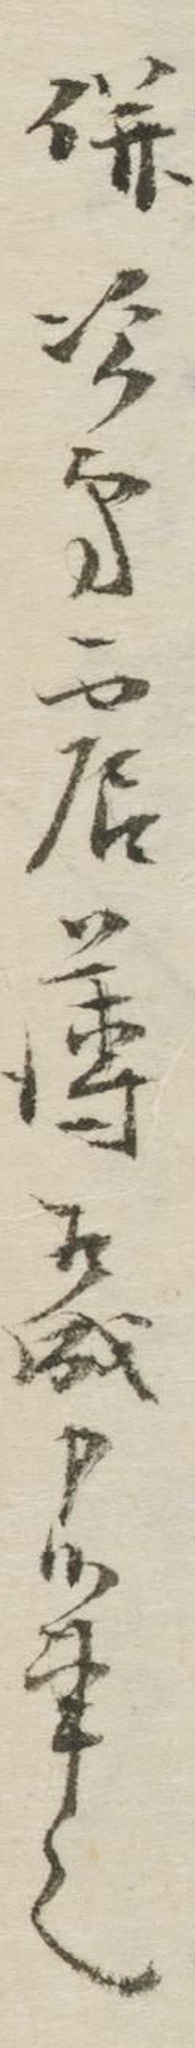併次第震薄相成申候事也

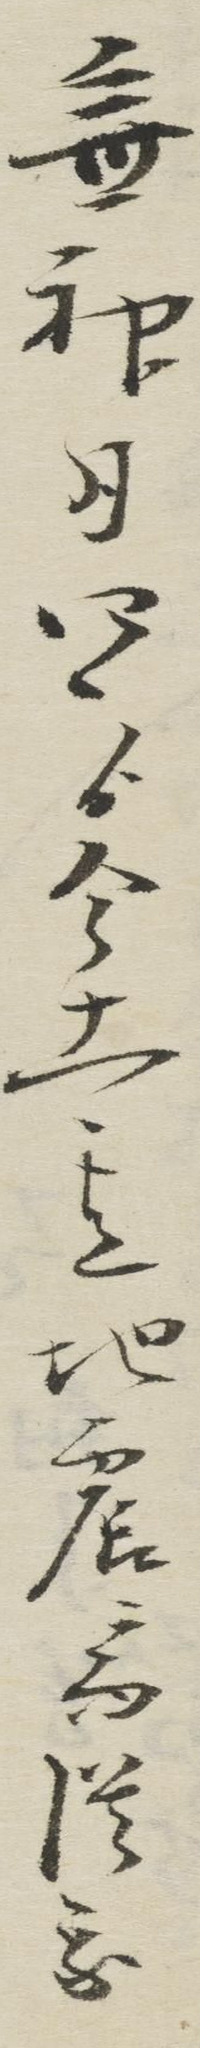無神月四日ゟ今十一日迄地震ニ而潰家
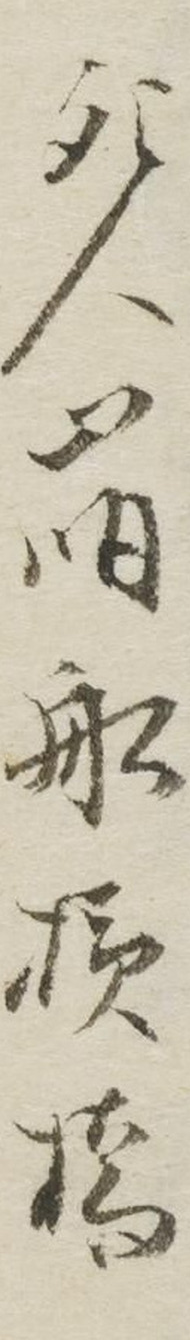死人崩船損橋
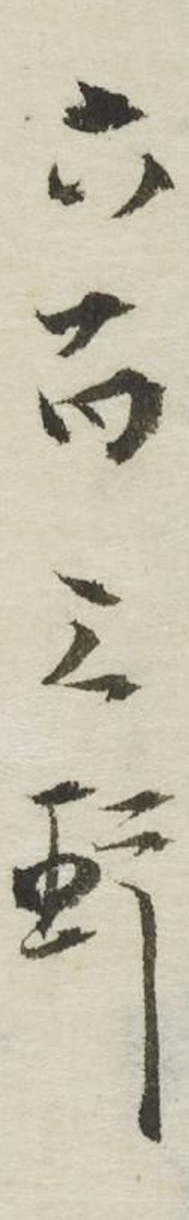六百三軒
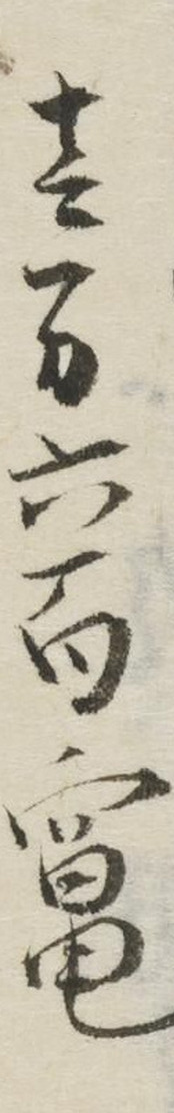壱万六百竈
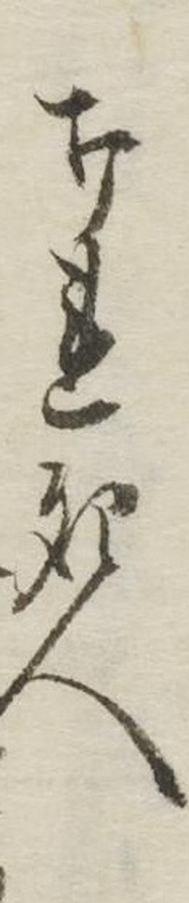打れ死人
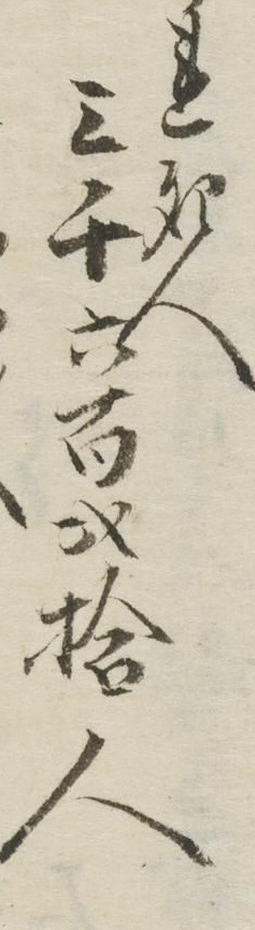三千六百弐拾人
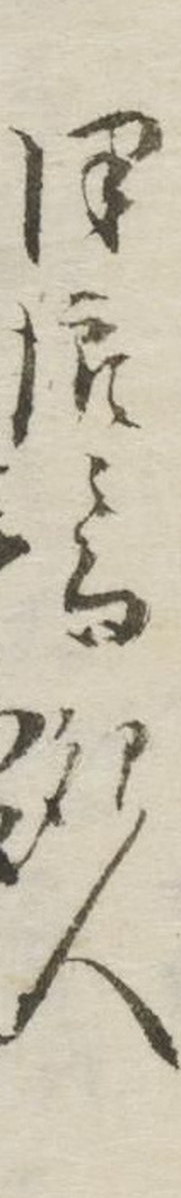津浪ニ而死人
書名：諸国大地震大津波一代記
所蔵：東京大学地震研究所図書室 Earthquake Research Institute Library, The University of Tokyo, JAPAN
